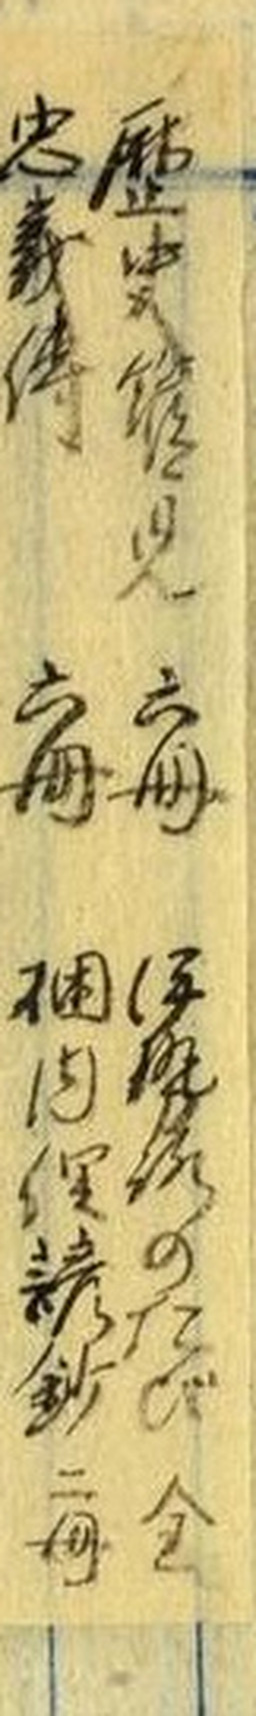忠義伝六冊梱内俚諺鈔二冊
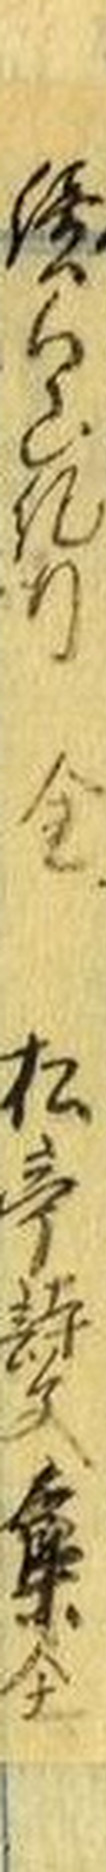続白山紀行全松亭詩文集全
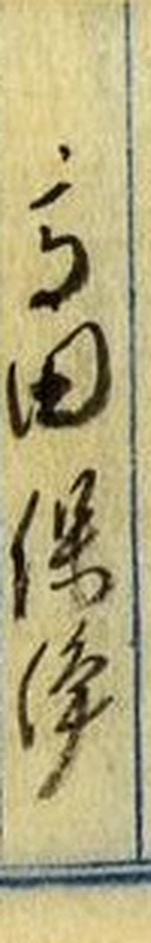高田保浄
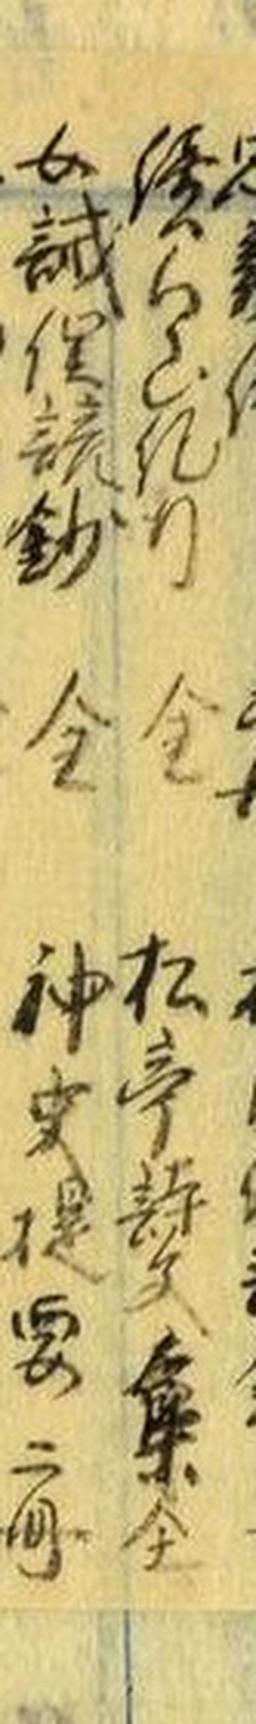女誡俚諺鈔全神官提要二冊
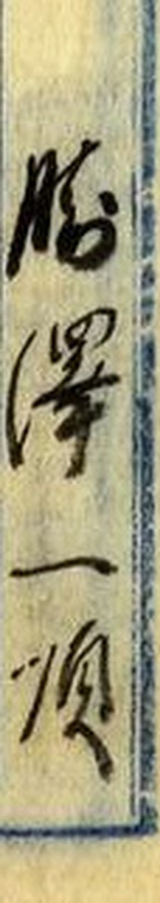勝澤一順
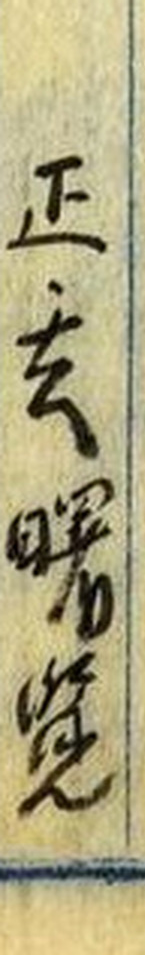正玄曙覧
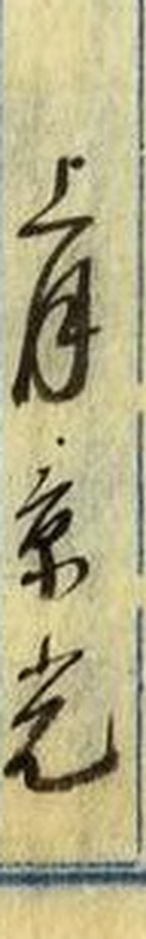上月景光

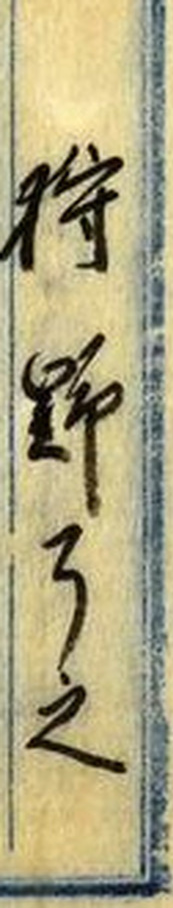狩野了之

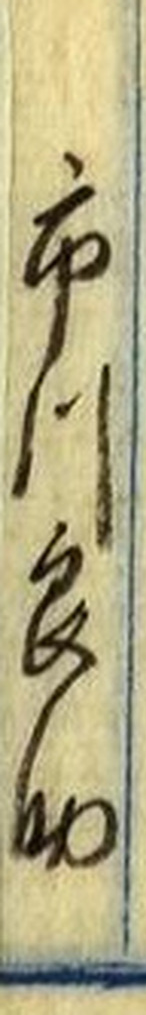市川良助
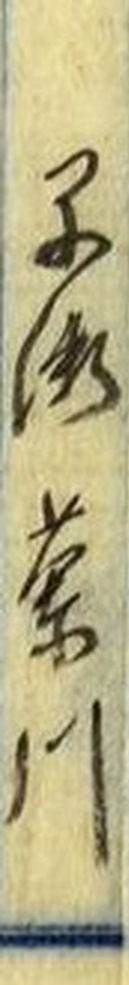早瀬蘭川
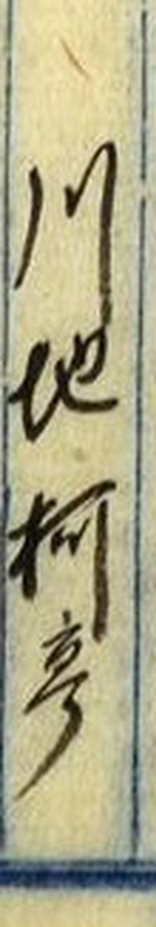川地柯亭

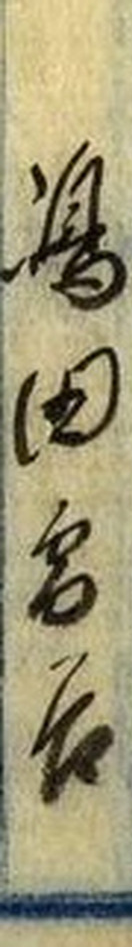嶋田雪谷
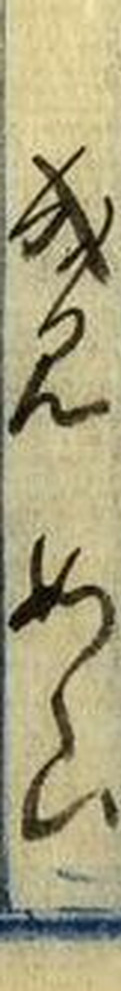成見如山
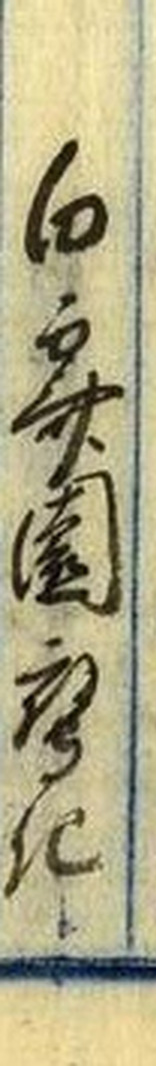白鼻園鷹記
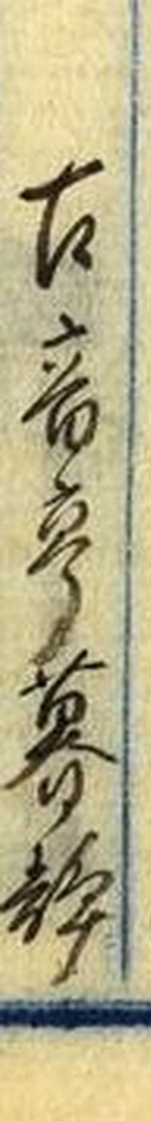古音亭暮静

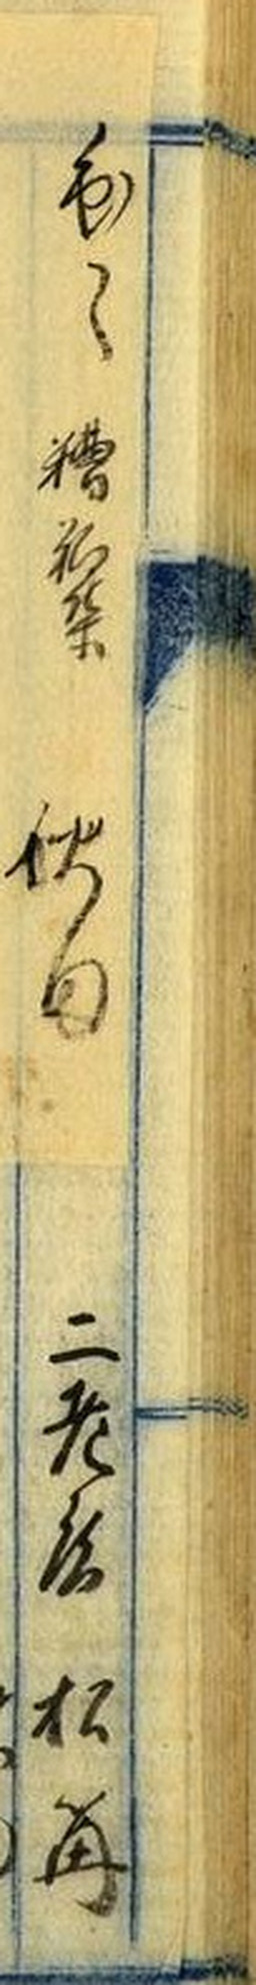「色々糟粕集秋田」二老庵松苒
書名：温古集 四巻
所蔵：福井県文書館 Fukui Prefectural Archives
